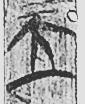立
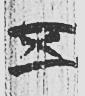五
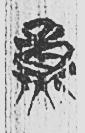員
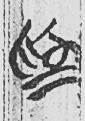爲
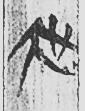吳
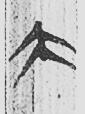太
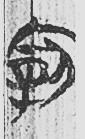{宀辛刀}
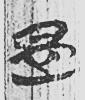是
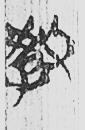教
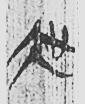吳
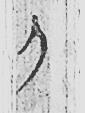人
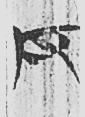反
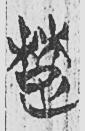楚
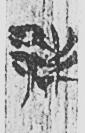邦
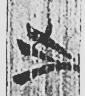之
